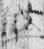城
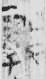龔
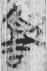頡
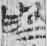爲
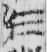於
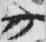方
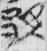○（鄢）
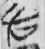左
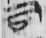司
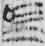馬
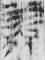競
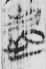慶
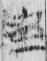爲
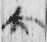大
